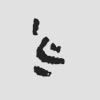水
